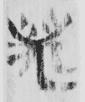萬
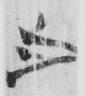之
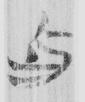此
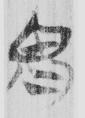胃
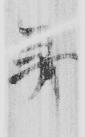𡵂
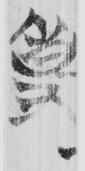事
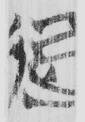起
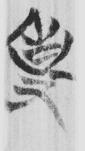事
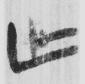亡
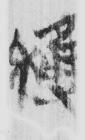穫
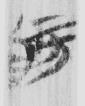{疒方}
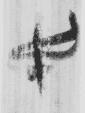民
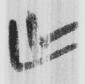亡
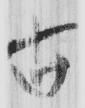古
